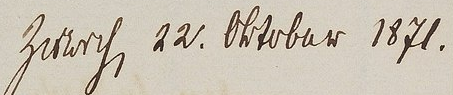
Zürich, 22. October 1871.
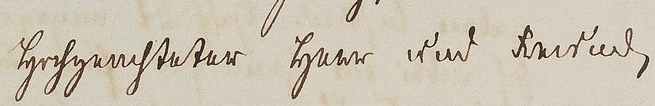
Hochgeachteter Herr und Freund,
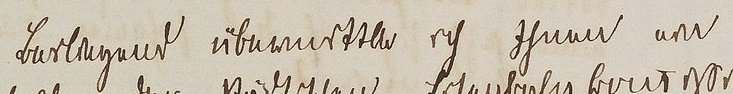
Beiliegend übermittle ich Ihnen ein
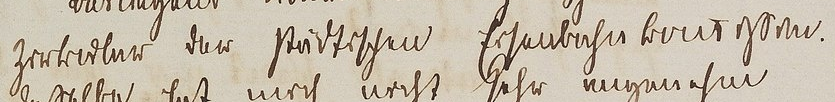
Zirkular der städtischen Eisenbahnkommission.
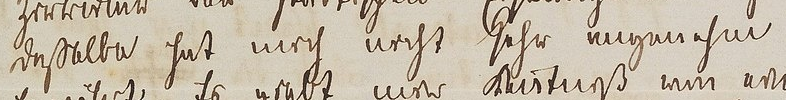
Dasselbe hat mich nicht sehr angenehm
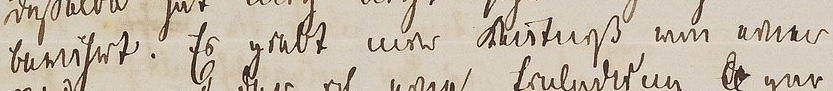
berührt. Es giebt mir Kenntniß von einer
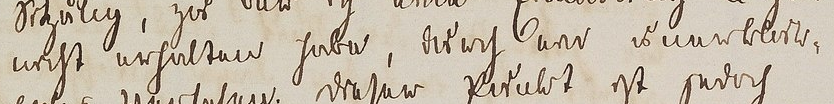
nicht erhalten habe, durch ein unerklär-
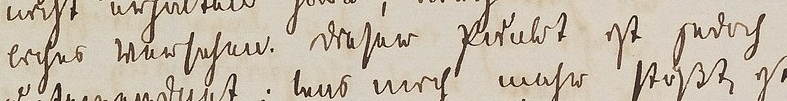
liches Versehen. Dieser Punkt ist jedoch
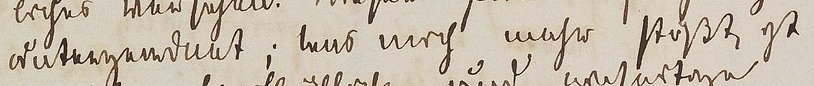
untergeordnet; was mich mehr stößt, ist
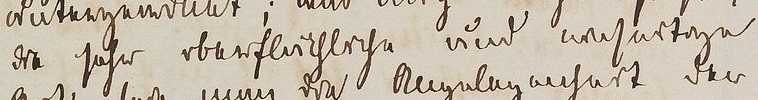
die sehr oberflächliche und einseitige
